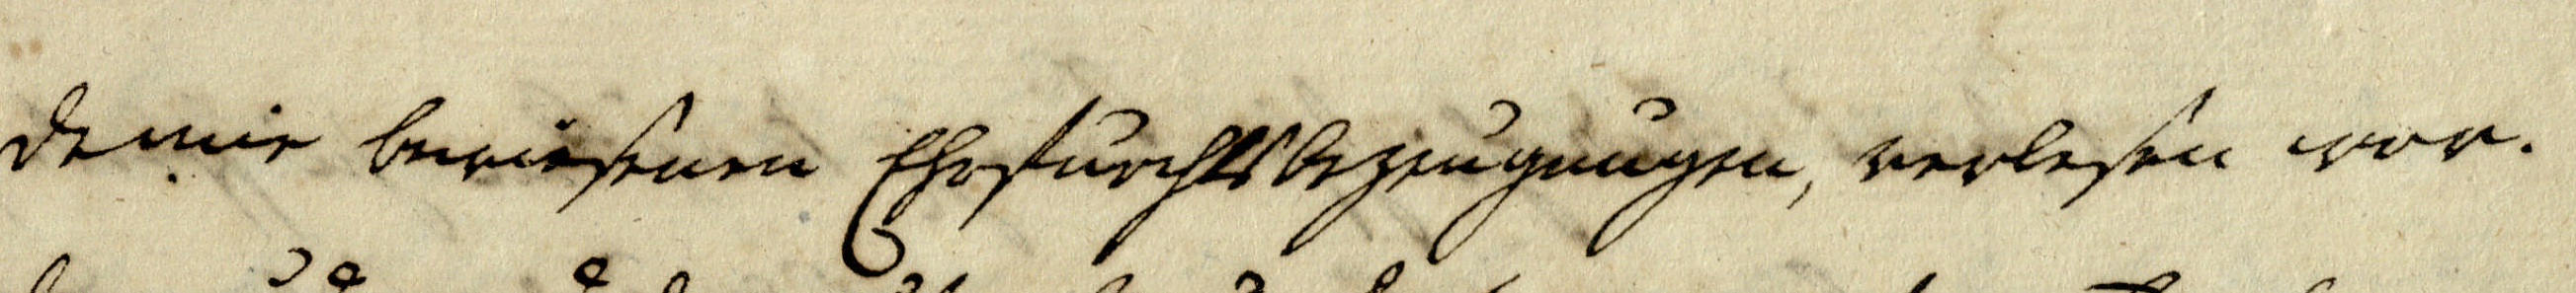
demie bewiesenen Ehrfurchtsbezeugungen, verlesen wor¬
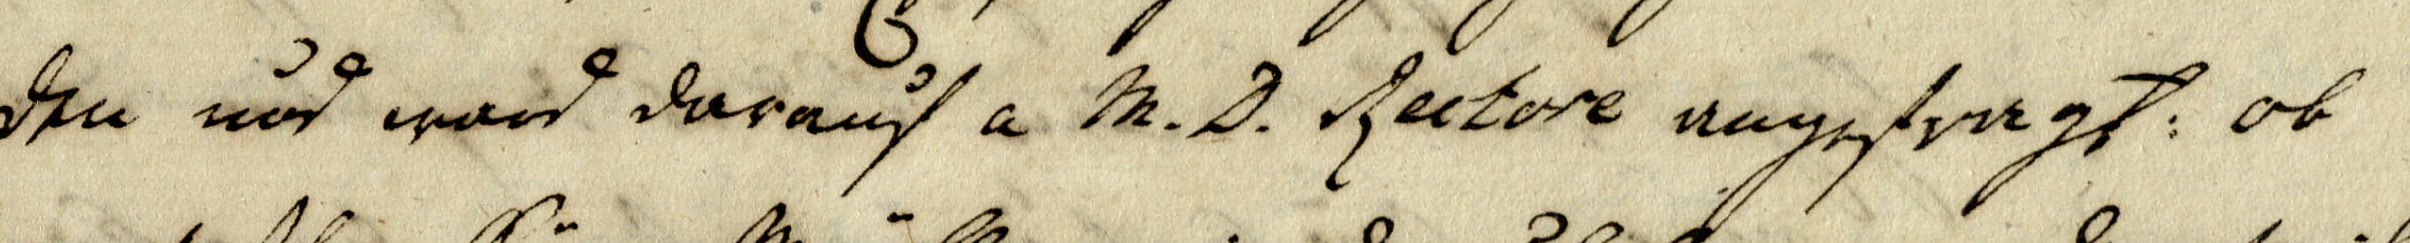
den und ward darauf a M. D. Rectore angefragt: ob
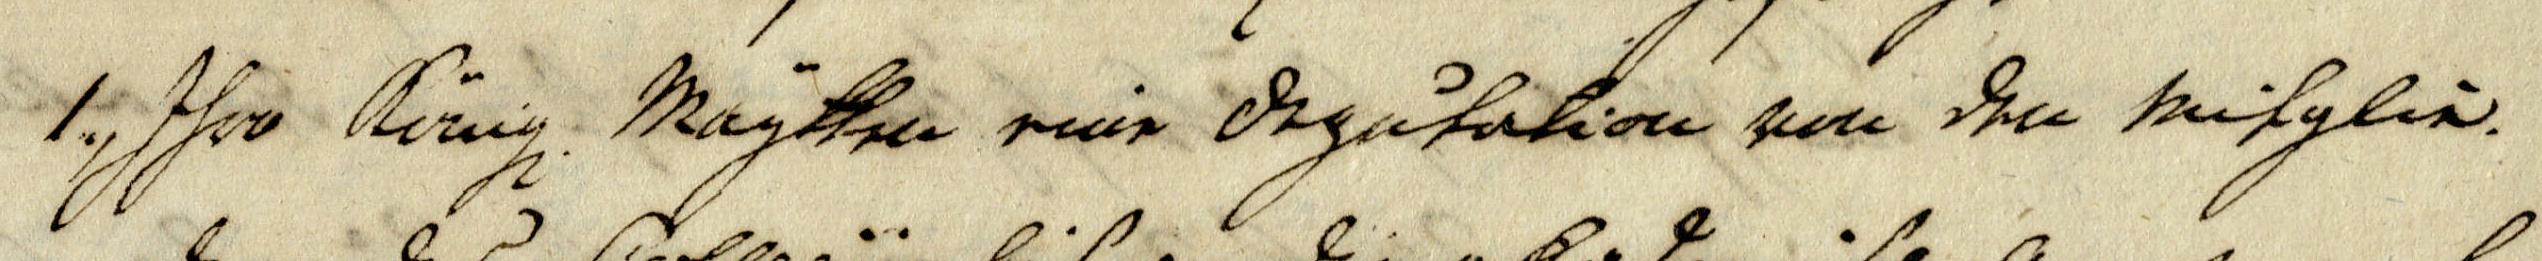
1., Ihro König. Maÿtten eine Deputation von den Mitglie¬
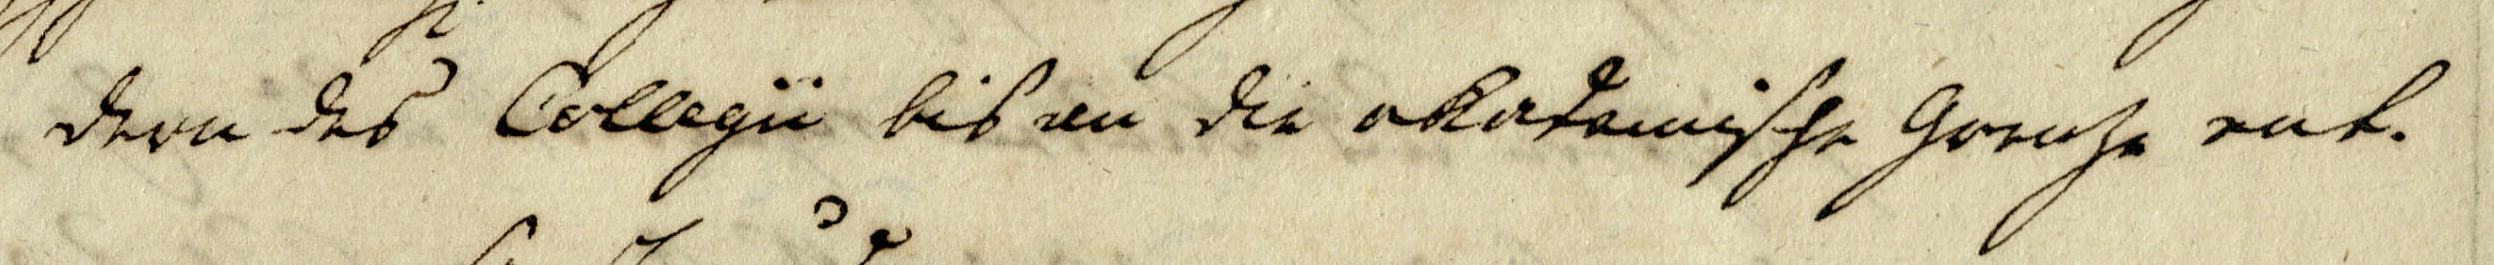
dern des Collegii bis an die akademische Grenze ent¬
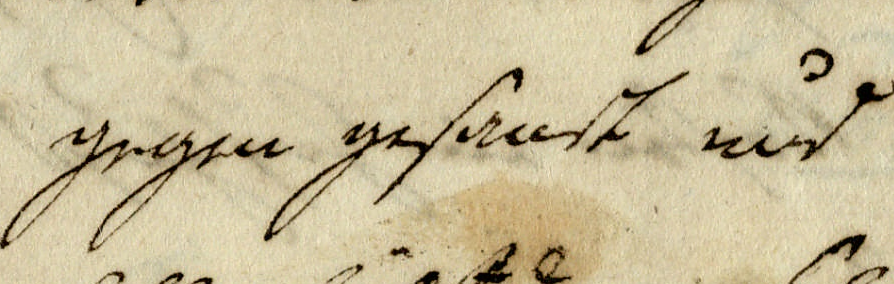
gegen gesandt und
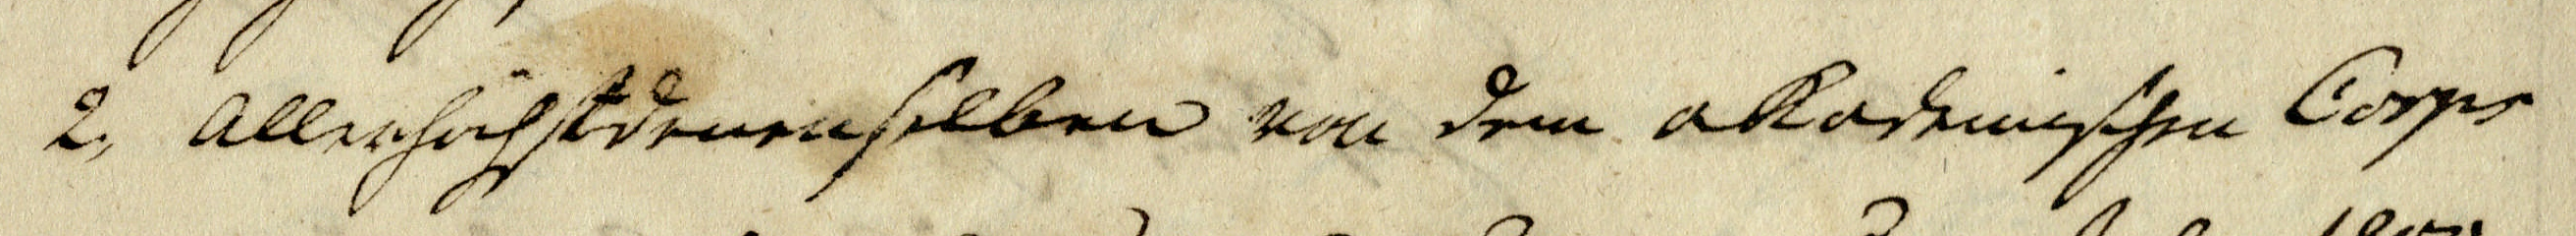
2., Allerhöchstdenenselben von dem akademischen Corps
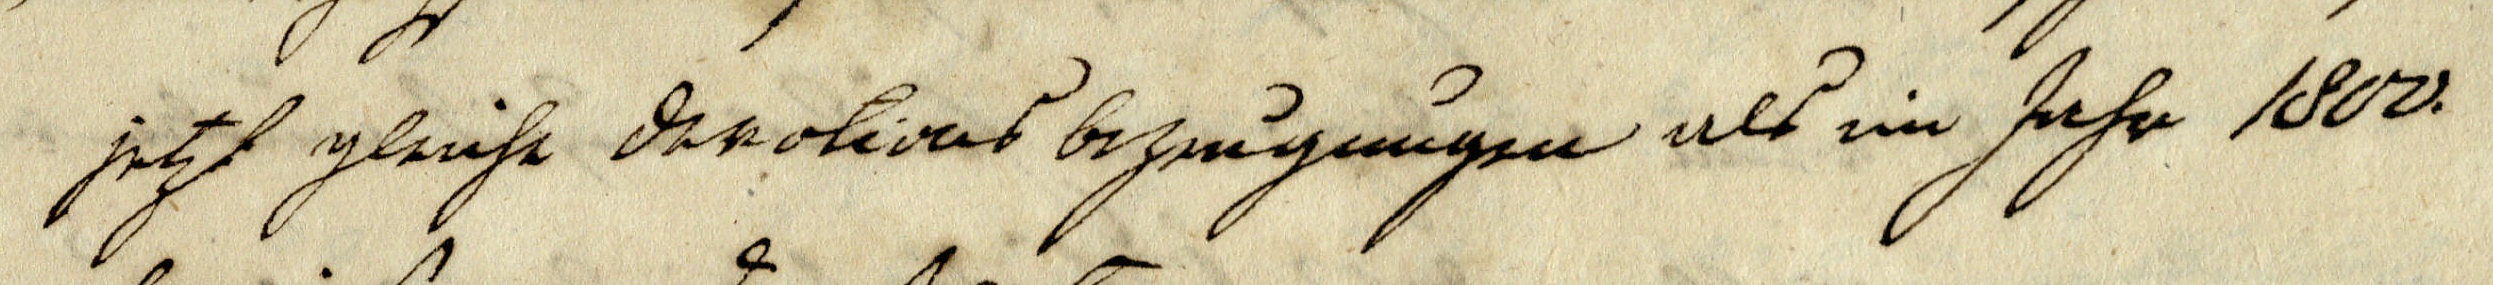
jetzt gleiche Devotions bezeugungen als im Jahr 1800.
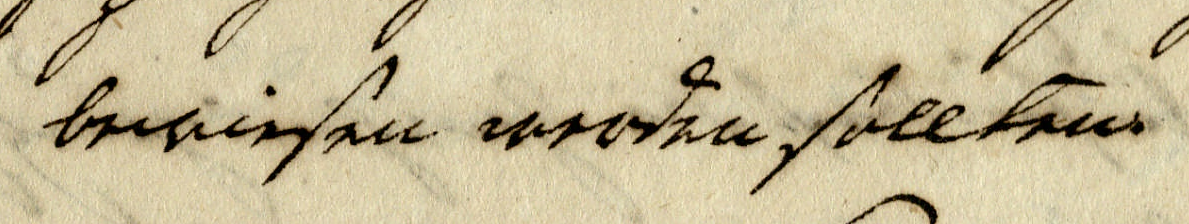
bewiesen werden sollten.
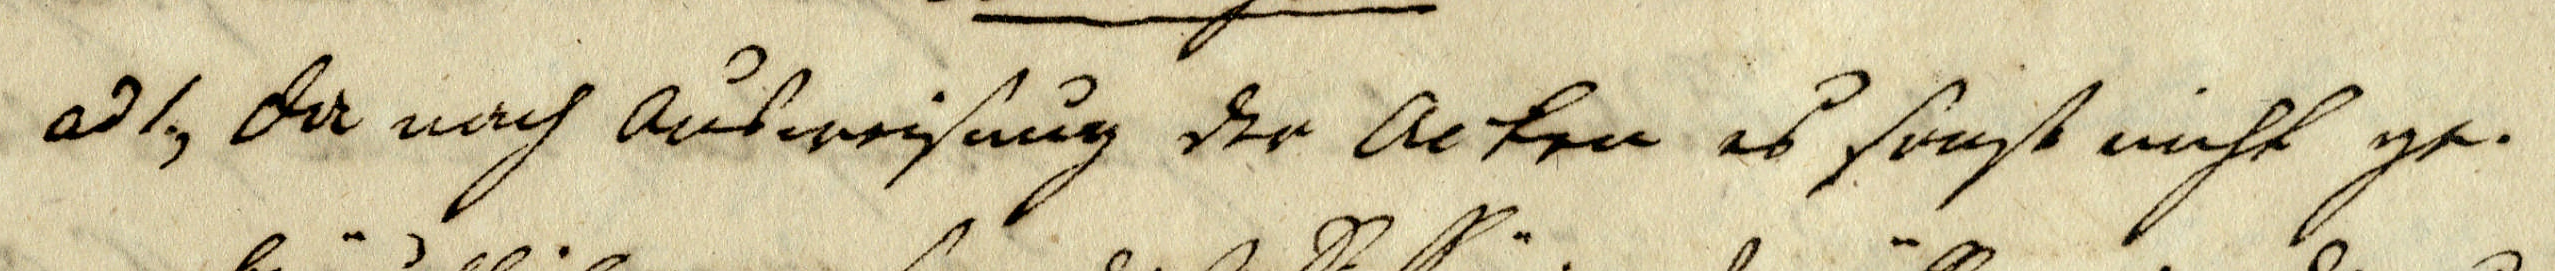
ad 1., Da nach Ausweisung der Acten es sonst nicht ge¬
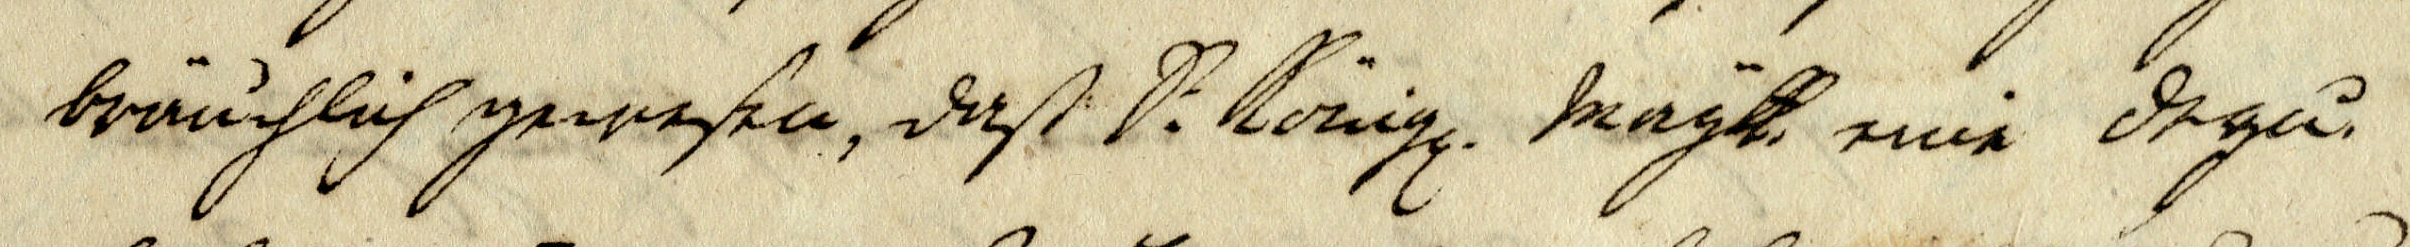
bräuchlich gewesen, daß Sr. Königl. Maÿtt. eine Depu¬
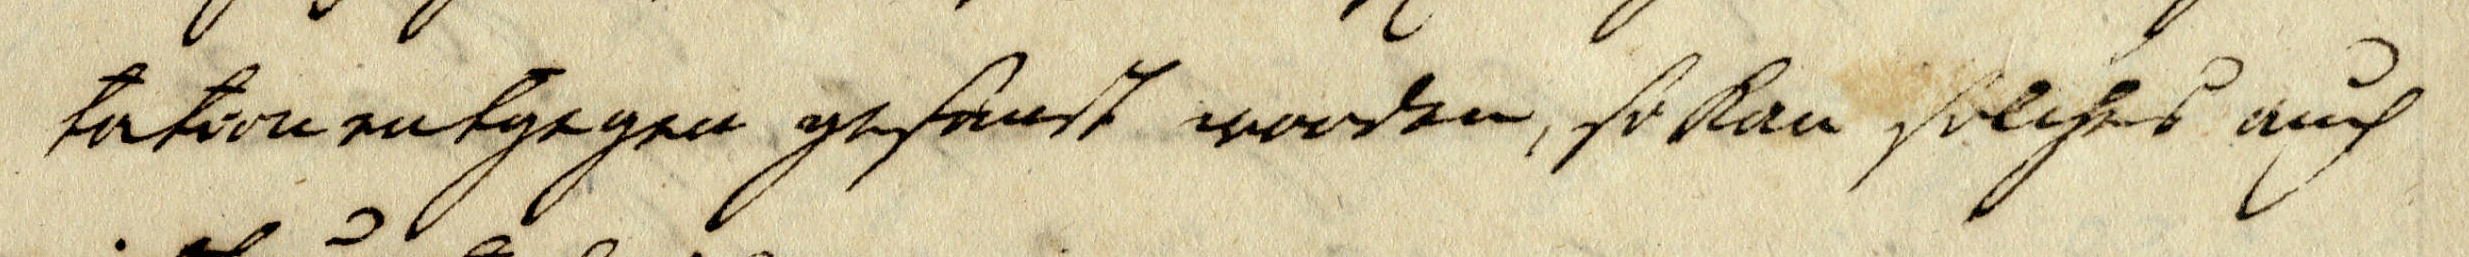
tation entgegen gesandt worden, so kan solches auch
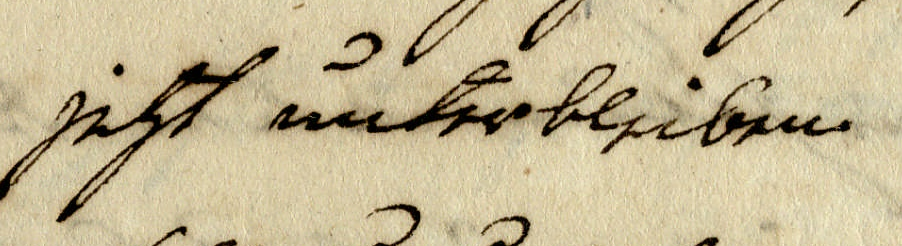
jetzt unterbleiben.
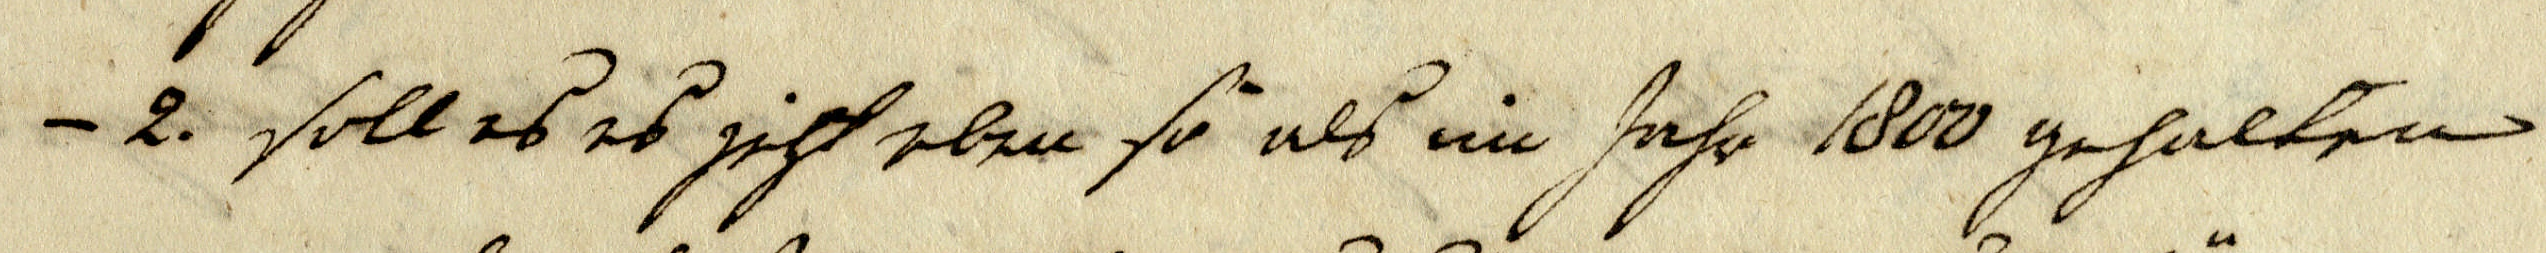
2. soll es es jetzt eben so als im Jahr 1800 gehalten
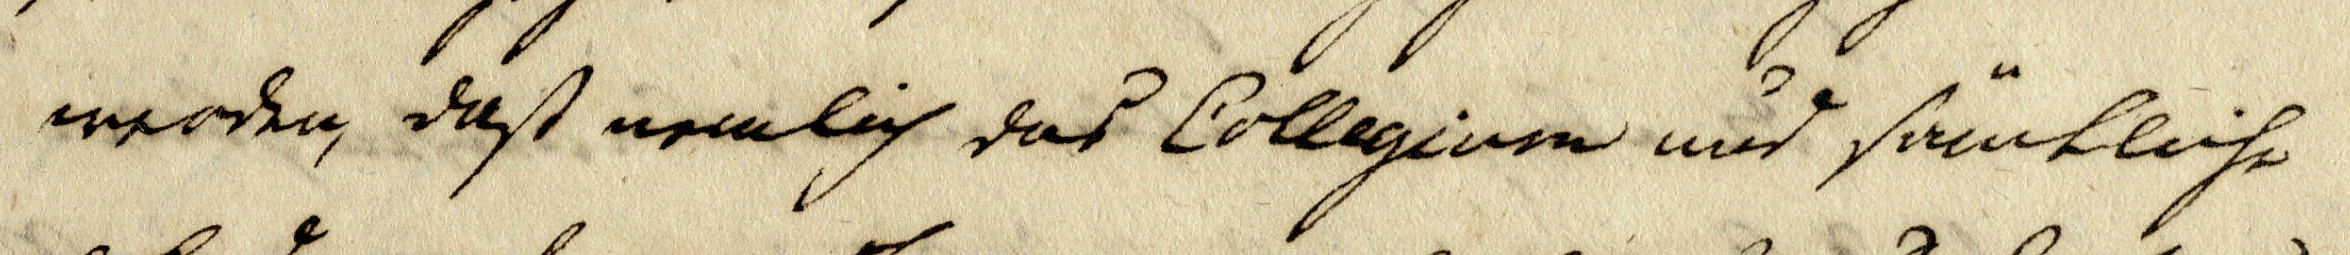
werden, daß nemlich das Collegium und sämtliche
